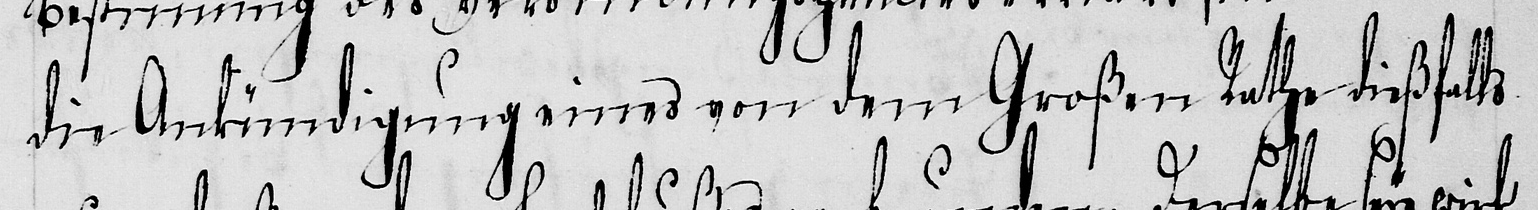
die Ankündigung eines von dem Großen Rathe dießfalls
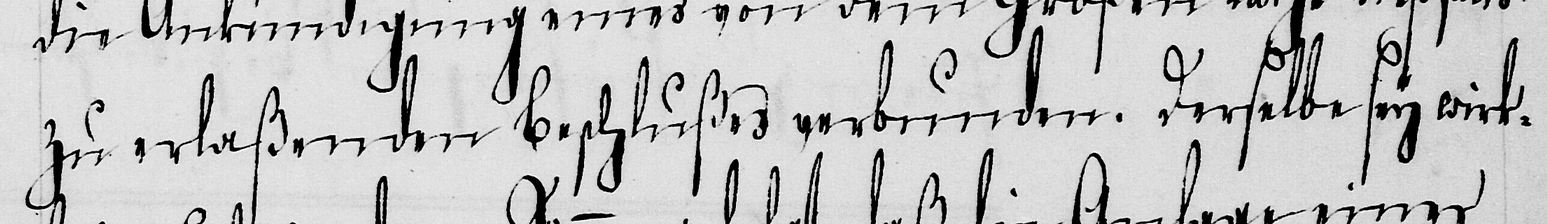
zu erlaßenden Beschlußes verbunden. Derselbe sey
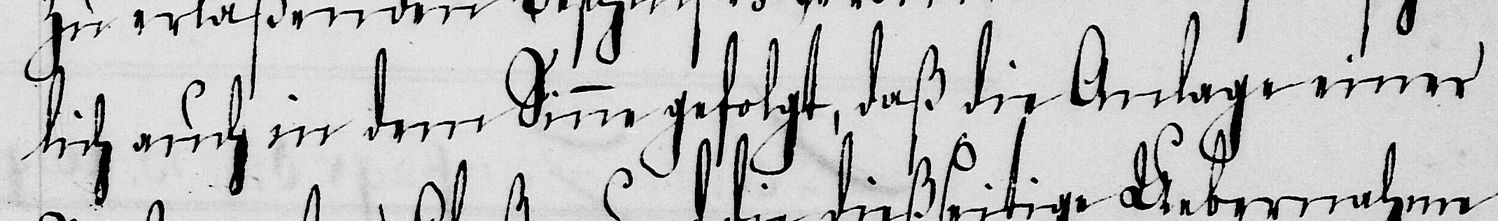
lich auch in dem Sinne gefolgt, daß die Anlage einer
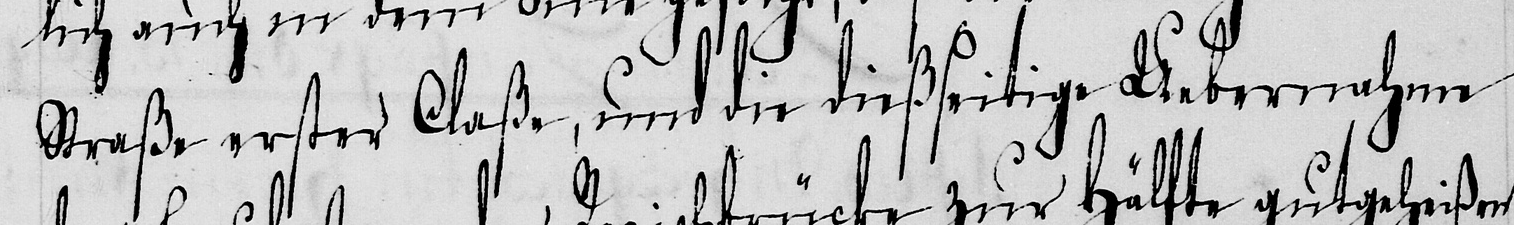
Straße erster Claße, und die dießseitige Uebernahme
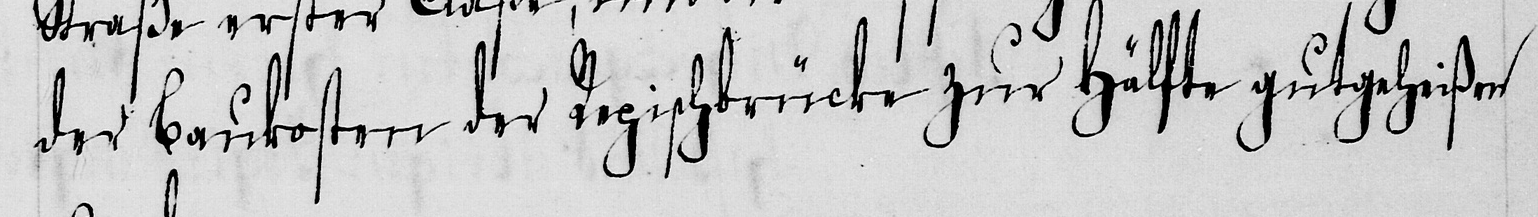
der Baukosten der Repischbrücke [sic!] zur Hälfte
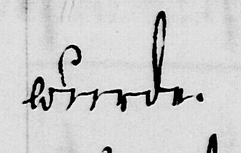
wurde.
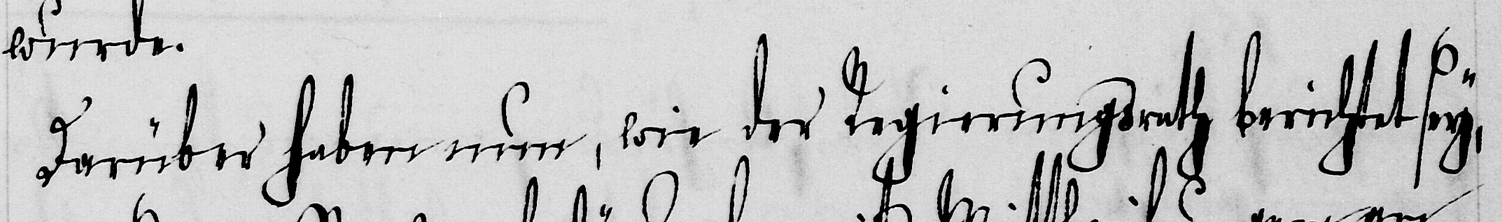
Darüber haben nun, wie der Regierungsrath berichtet
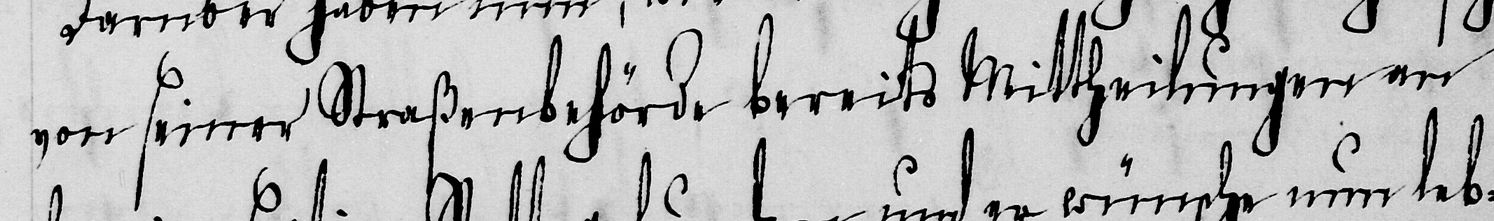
von seiner Straßenbehörde bereits Mittheilungen an
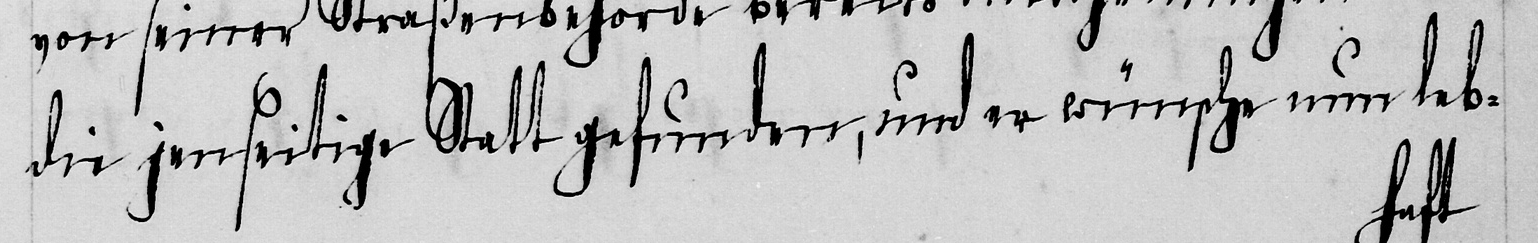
die jenseitige Statt gefunden, und er wünsche nun leb-
